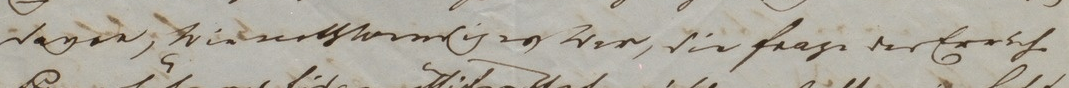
davon, wie nothwendig es war, die Frage der Errich-
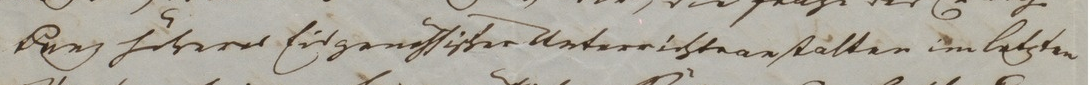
tung höherer Eidgenössischer Unterrichtsanstalten im letzten
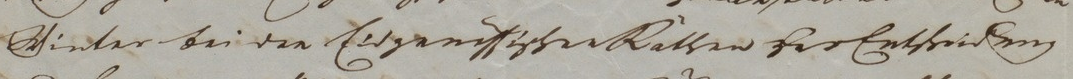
Winter bei den Eidgenössischen Räthen zur Entscheidung
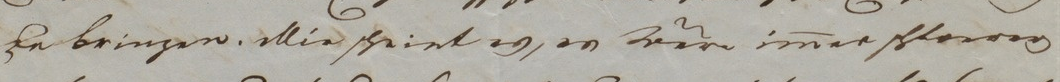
zu bringen. Mir scheint es, es wäre immer schwerer
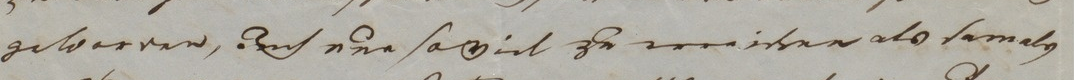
geworden, auch nur soviel zu erreichen als damals
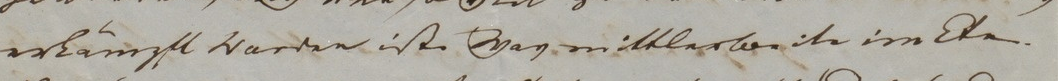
erkämpft worden ist. Was mittlerweile im Ctn.
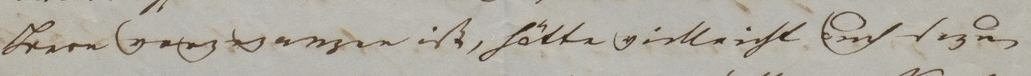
Bern vorgegangen ist, hätte vielleicht auch dazu
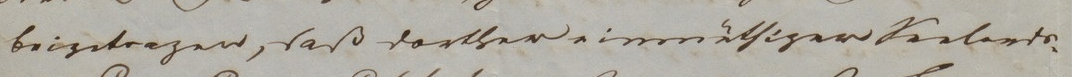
beigetragen, daß dorther einmüthiger Seelands -
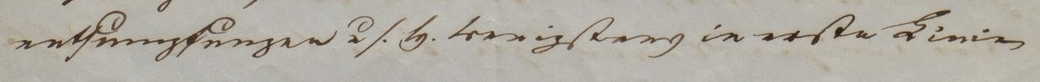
entsumpfungen u. s. w. wenigstens in erste Linie
